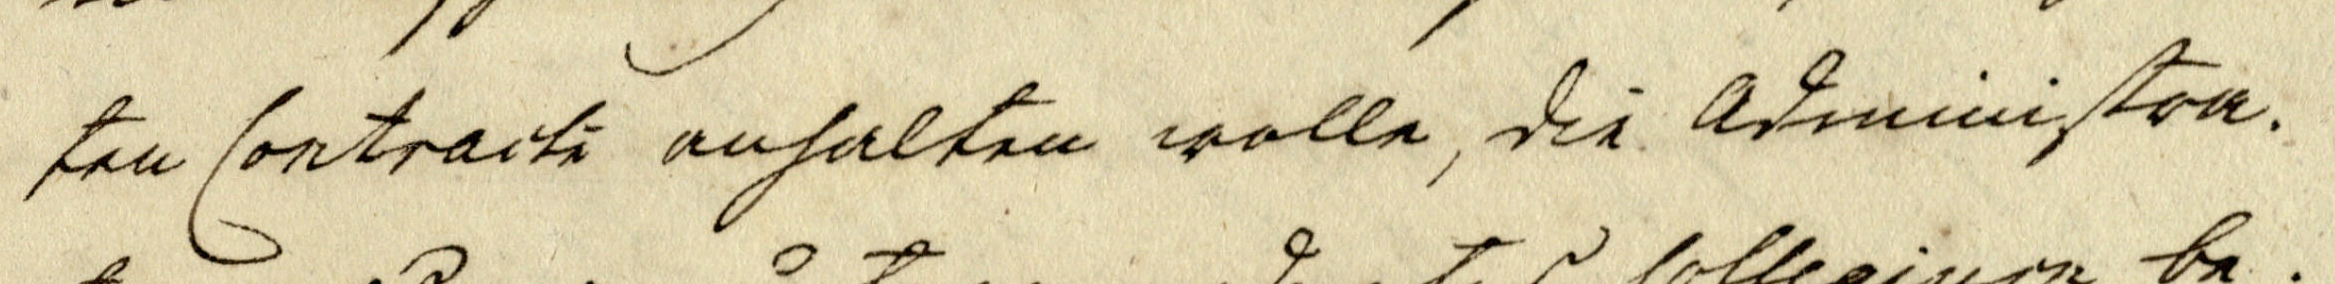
ten Contracte anhalten wolle, die Administra¬
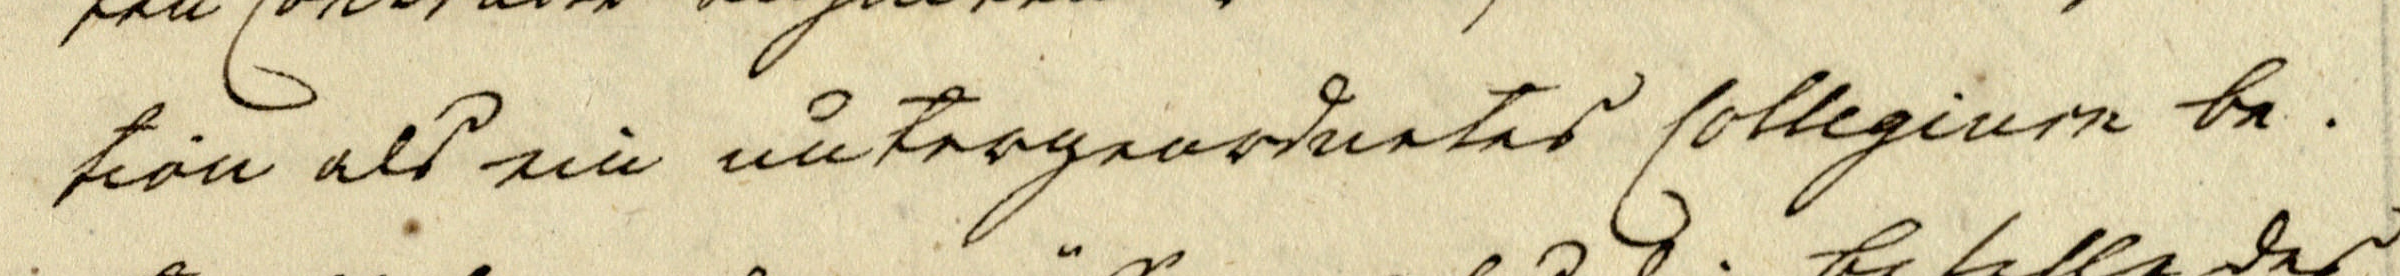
tion als ein untergeordnetes Collegium be¬
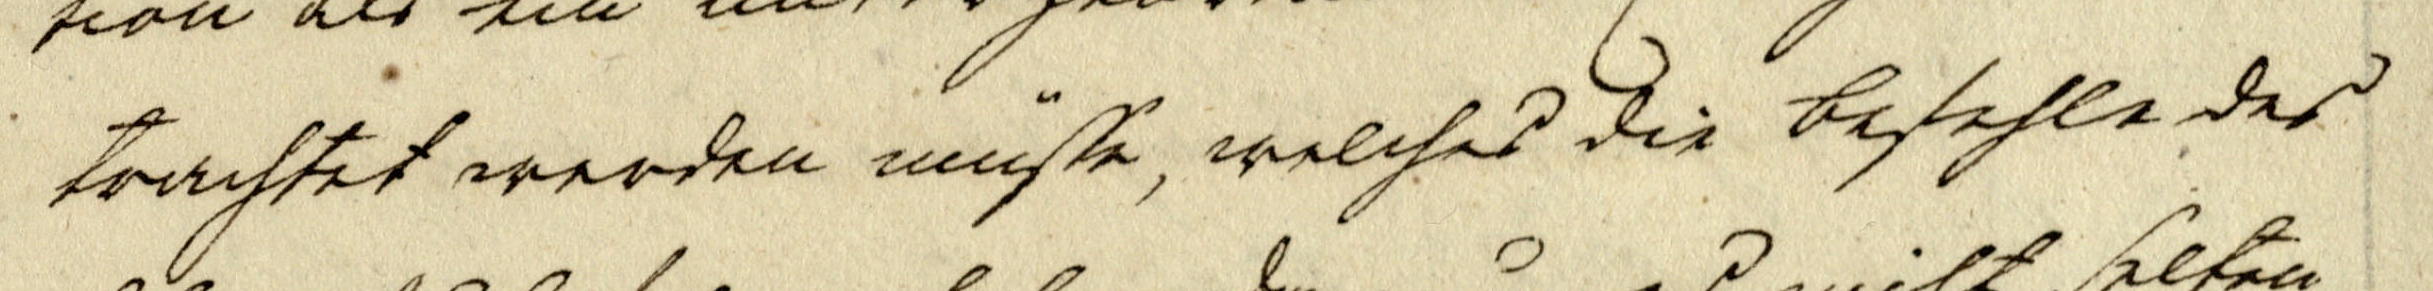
trachtet werden müsse, welches die Befehle des
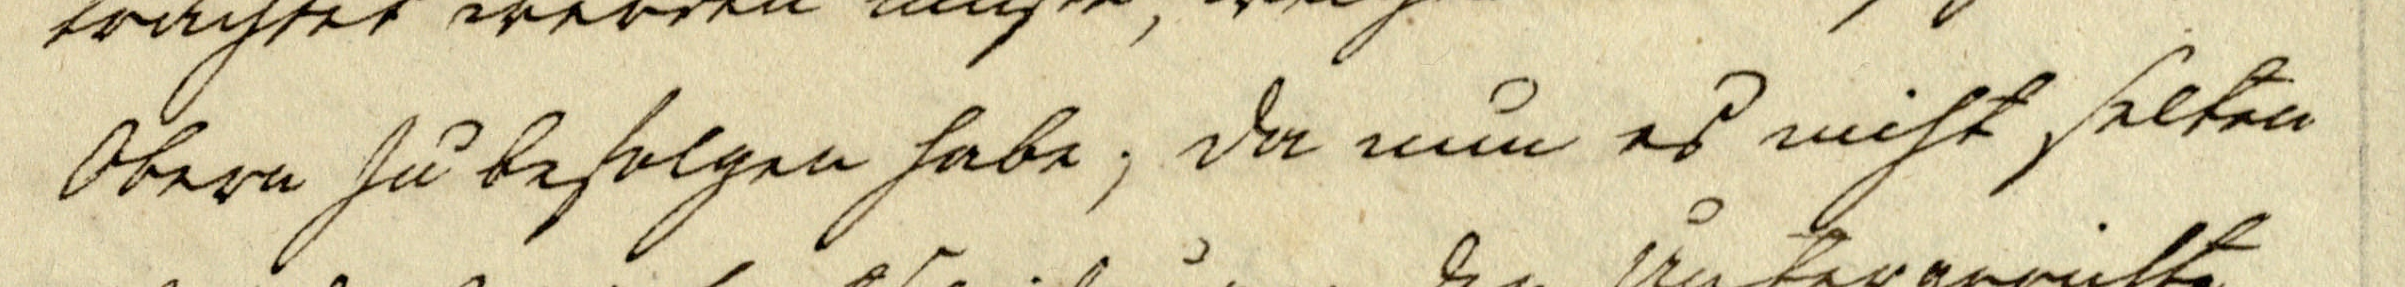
Obern zu befolgen habe; da nun es nicht selten
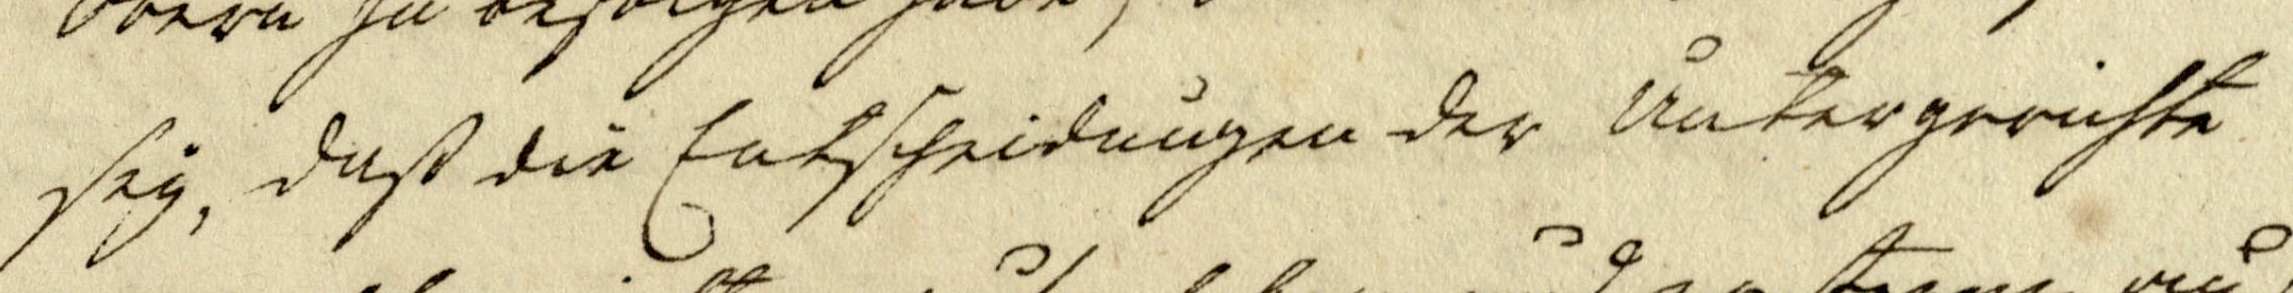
seÿ, daß die Entscheidungen der Untergerichte
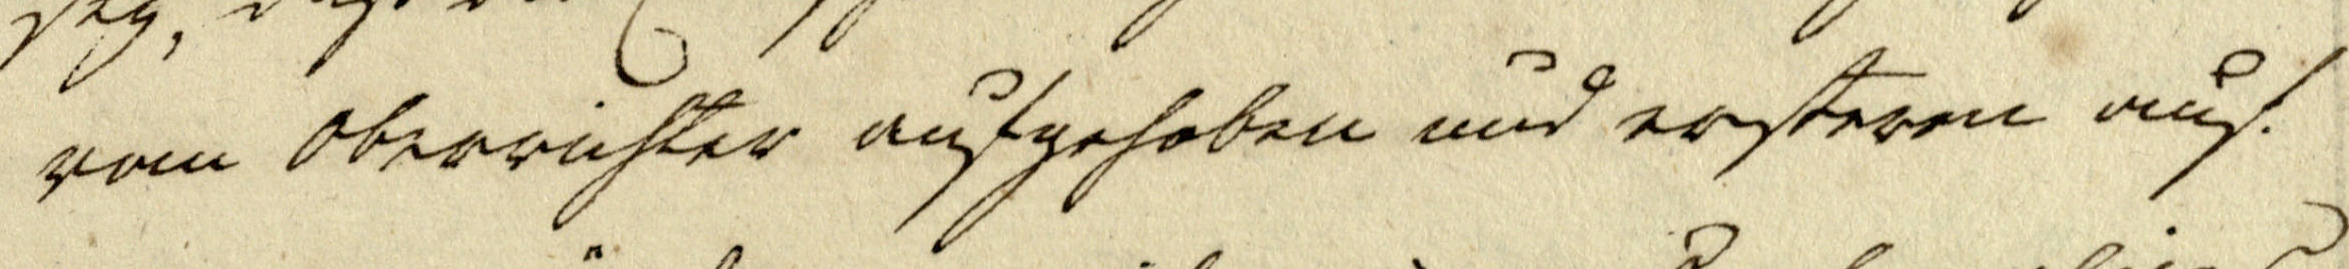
vom Oberrichter aufgehoben und ersteren auf¬
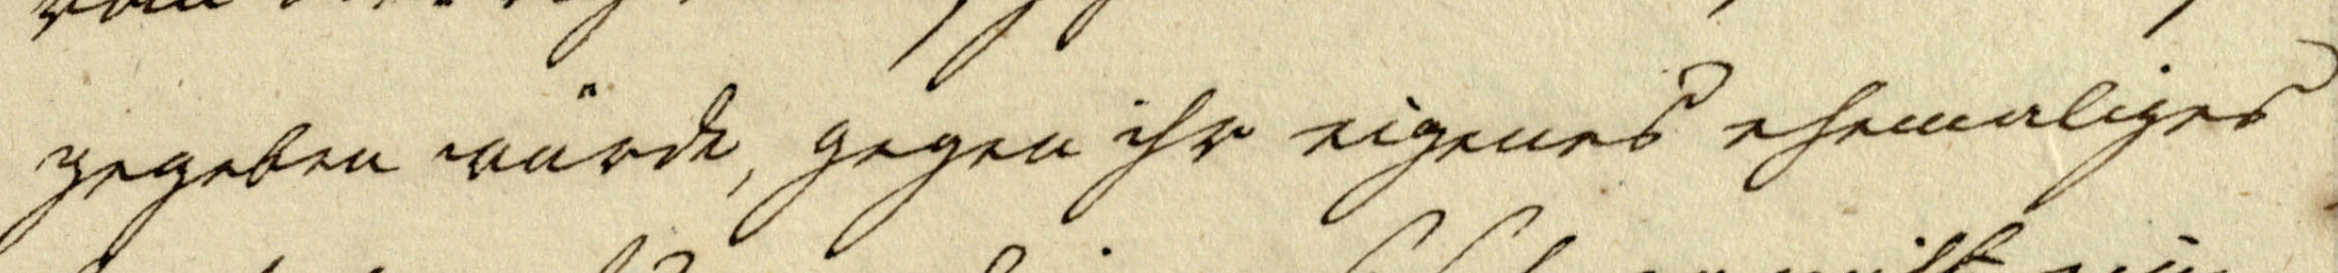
gegeben würde, gegen ihr eigenes ehemaliges
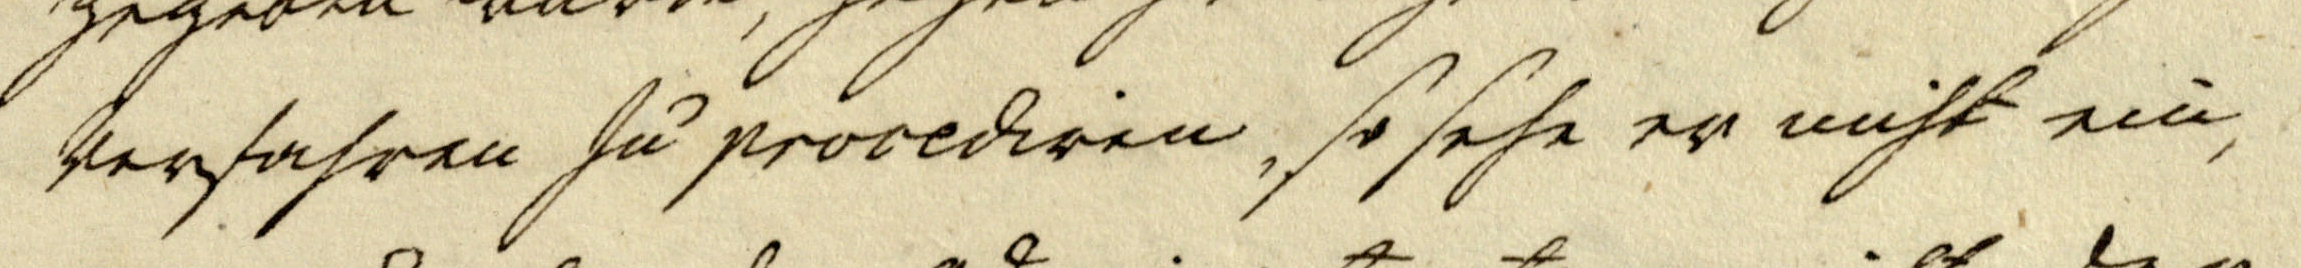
Verfahren zu procediren, so sehe er nicht ein,
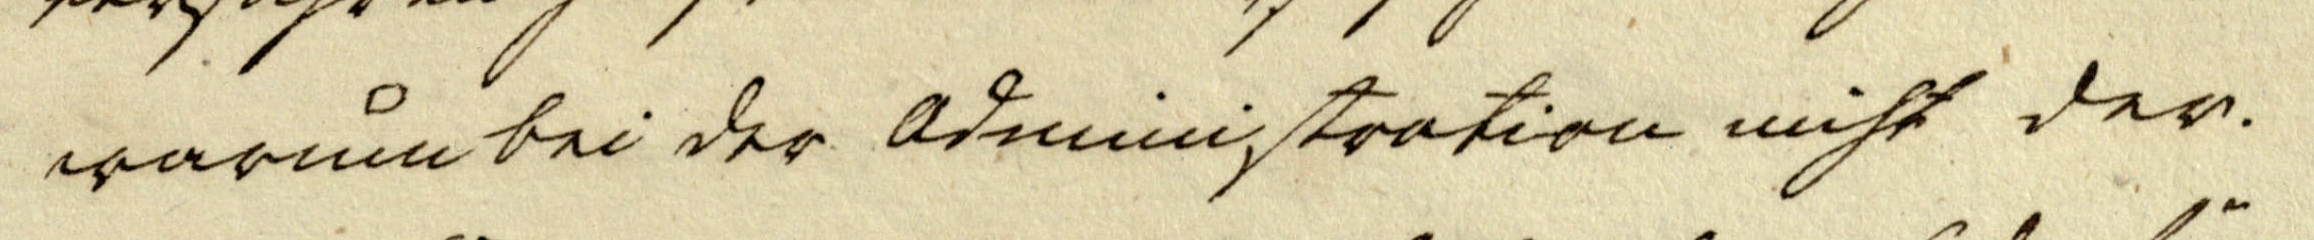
warum bei der Administration nicht der¬
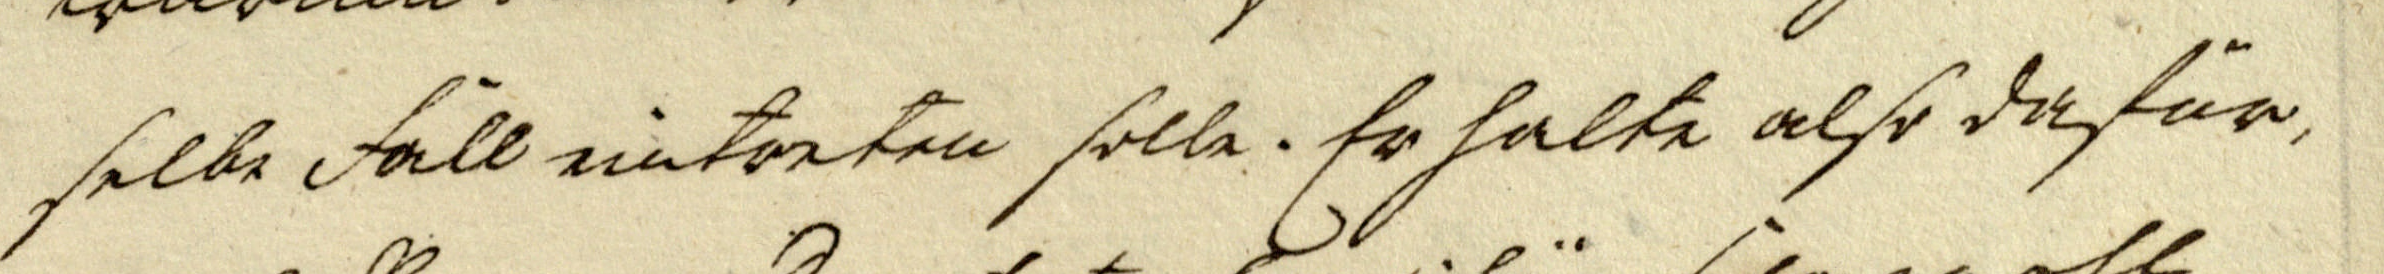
selbe Fall eintreten solle. Er halte also dafür,
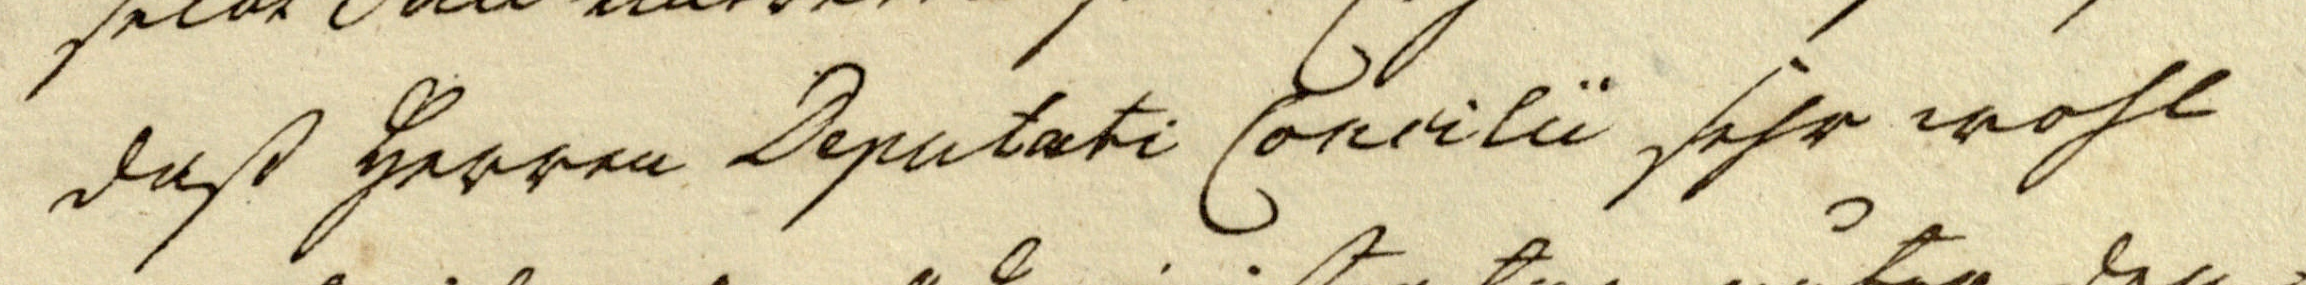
daß Herren Deputati Concilii sehr wohl
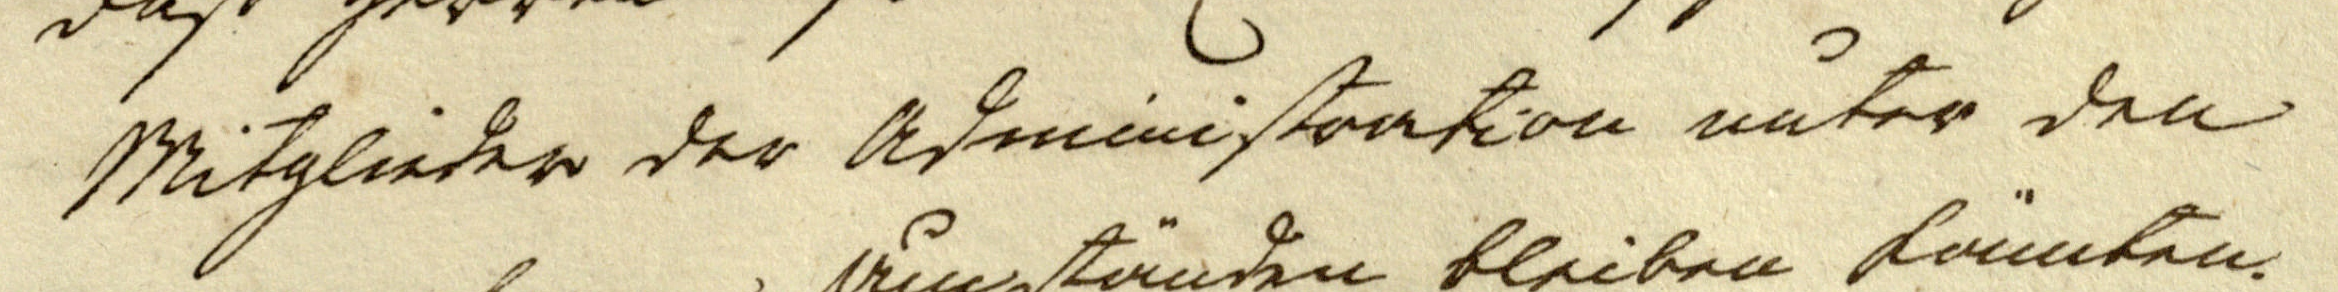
Mitglieder der Administration unter den
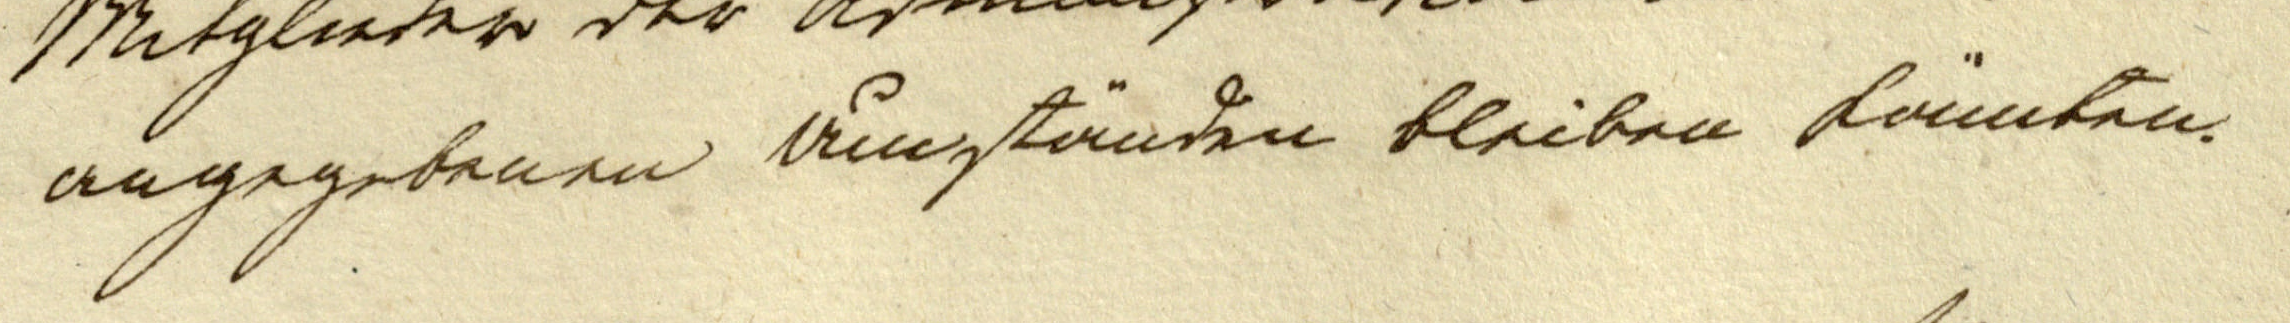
angegebenen Umständen bleiben könnten.
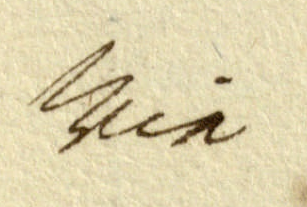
Wie
